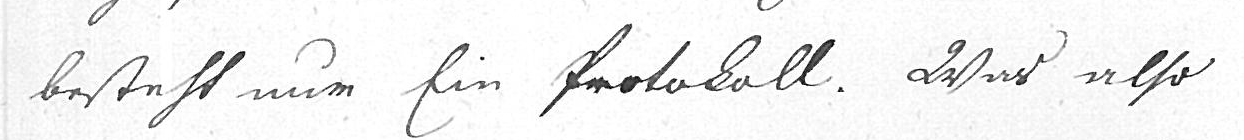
besteht nur ein Protokoll. Was also
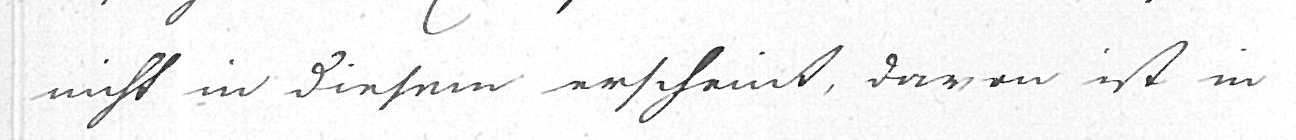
nicht in diesem erscheint, davon ist in
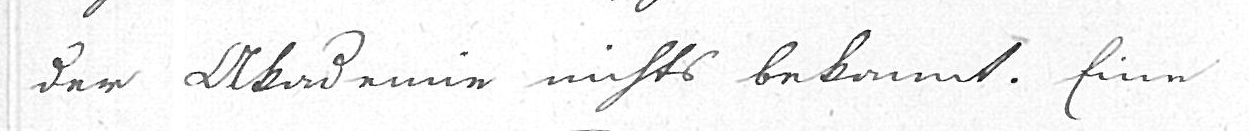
der Akademie nichts bekannt .Eine
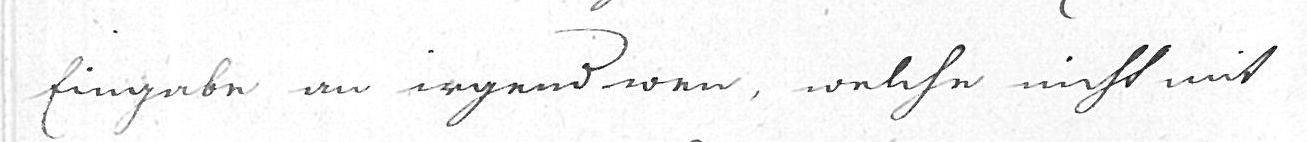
Eingabe an irgendwen, welche nicht mit
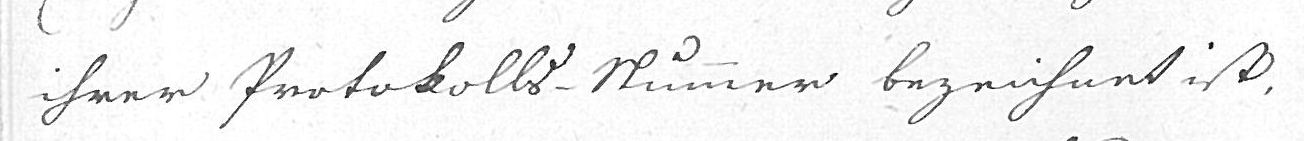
ihrer Protokolls-Nummer bezeichnet ist,
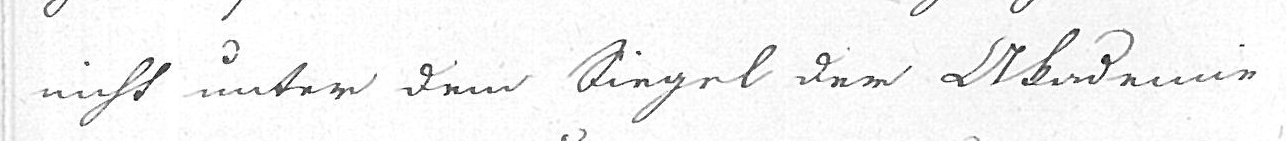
nicht unter dem Siegel der Akademie
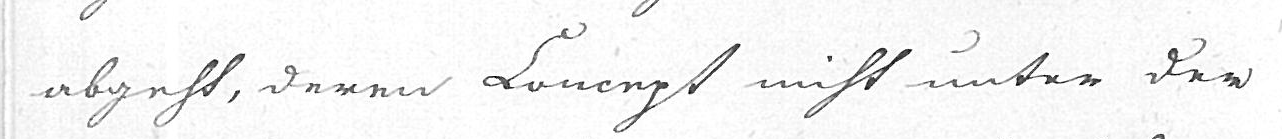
abgeht, deren Concept nicht unter der
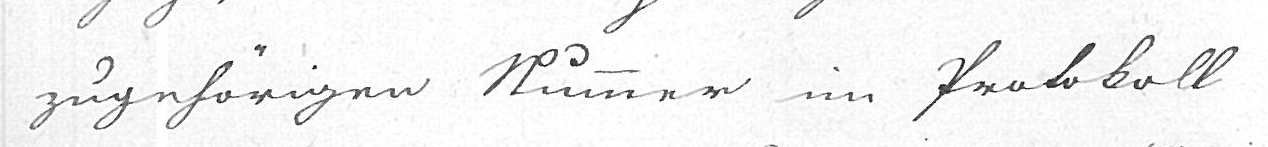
zugehörigen Nummer im Protokoll
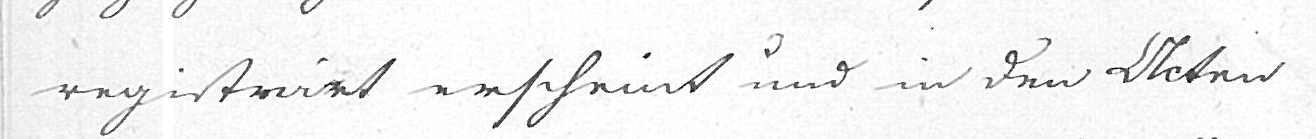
registrirt erscheint und in den Acten
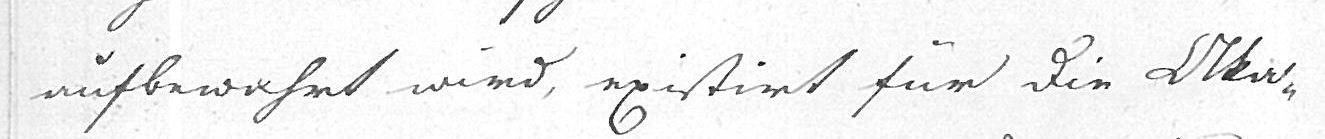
aufbewahrt wird, existirt für die Aka-
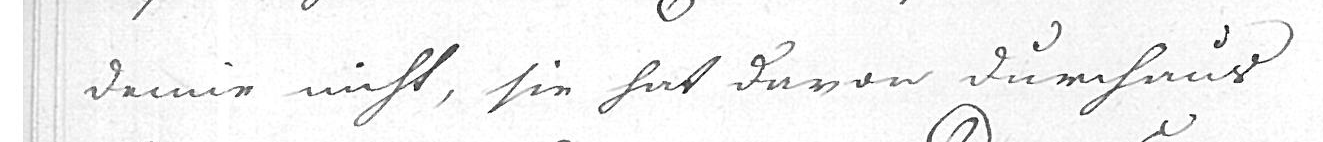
demie nicht, sie hat davon durchaus
